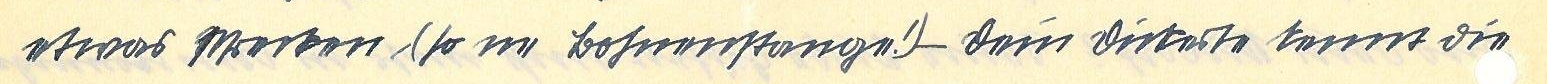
etwas schrecken, (so ne Bohnenstange!) – Dein Dickerle kennt die
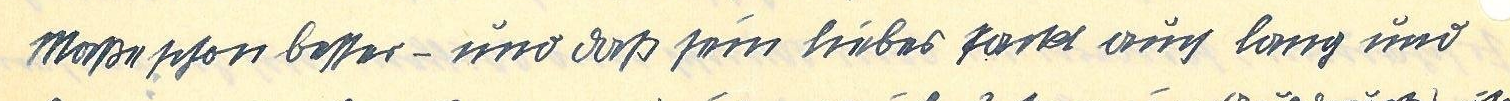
Maße schon besser – und daß sein liebes Packl auch lang und
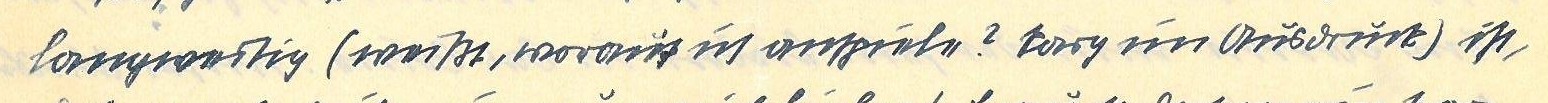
langweilig (weißt, worauf ich anspiele? karg im Ausdruck) ist,
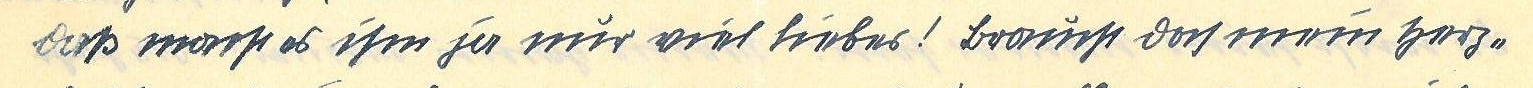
daß macht es ihm ja nur viel lieber! Braucht doch mein Herz¬
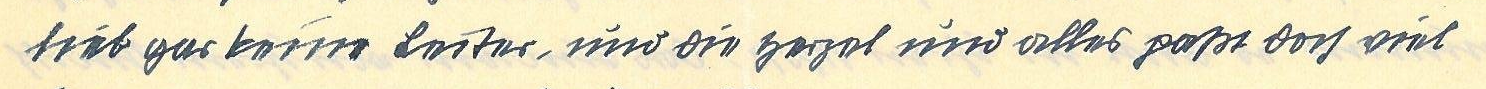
lieb gar keine Leiter, und die Herzel und alles paßt doch viel
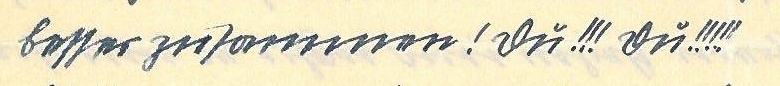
besser zusammen! Du!!! Du!!!!!
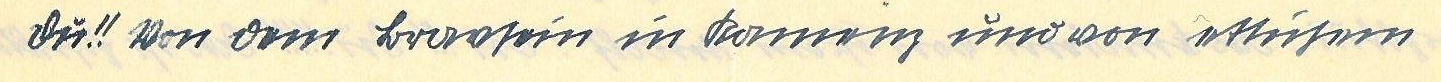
Du!! Von dem Bravsein in K. und von etlichem
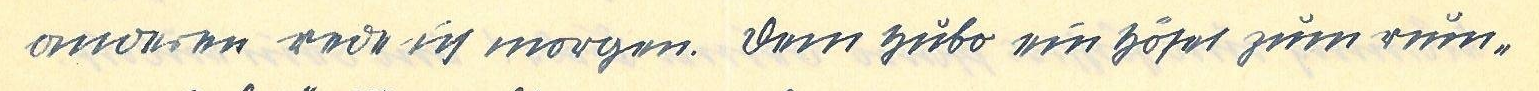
anderen rede ich morgen. Dem Hubo ein Hösel zum rum¬
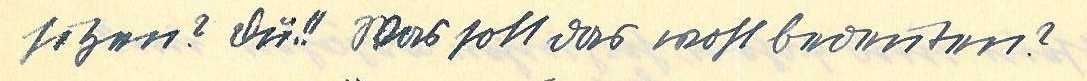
sitzen? Du!! Was soll das wohl bedeuten?
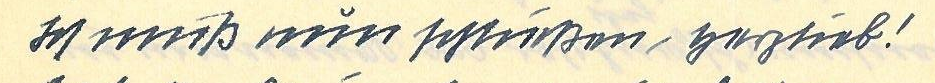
Ich muß nun schließen, Herzlieb!
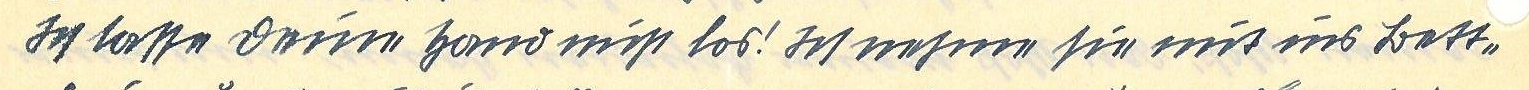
Ich lasse Deine Hand nicht los! Ich nehme sie mit ins Bett¬
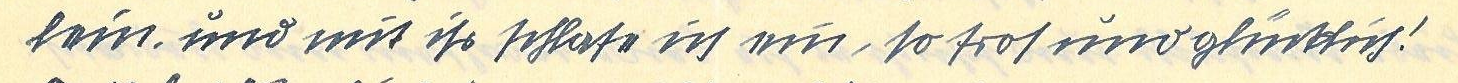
lein, und mit Ihr schlafe ich ein, so froh und glücklich!
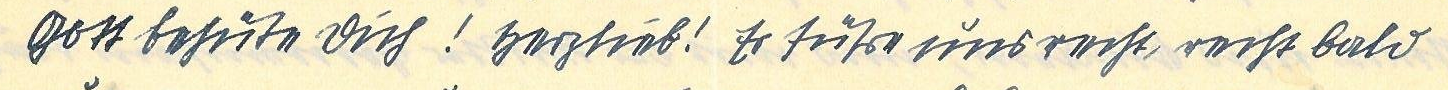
Gott behüte Dich! Herzlieb! Er führe uns recht, recht bald
